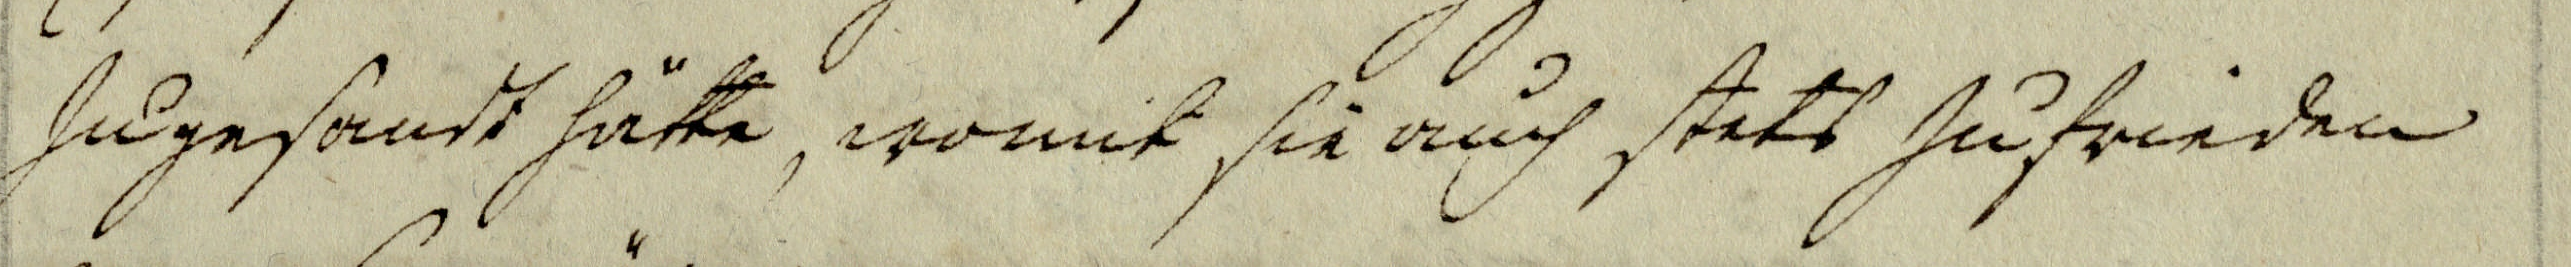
zugesandt hätte, womit sie auch stets zufrieden
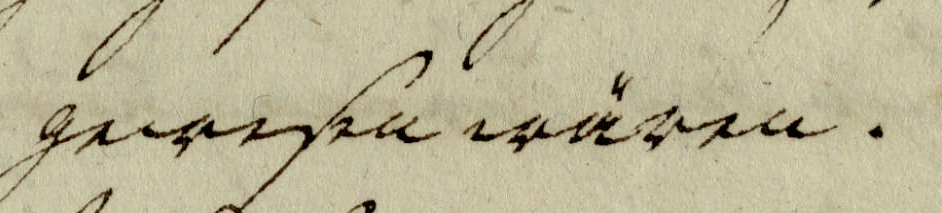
gewesen wären.
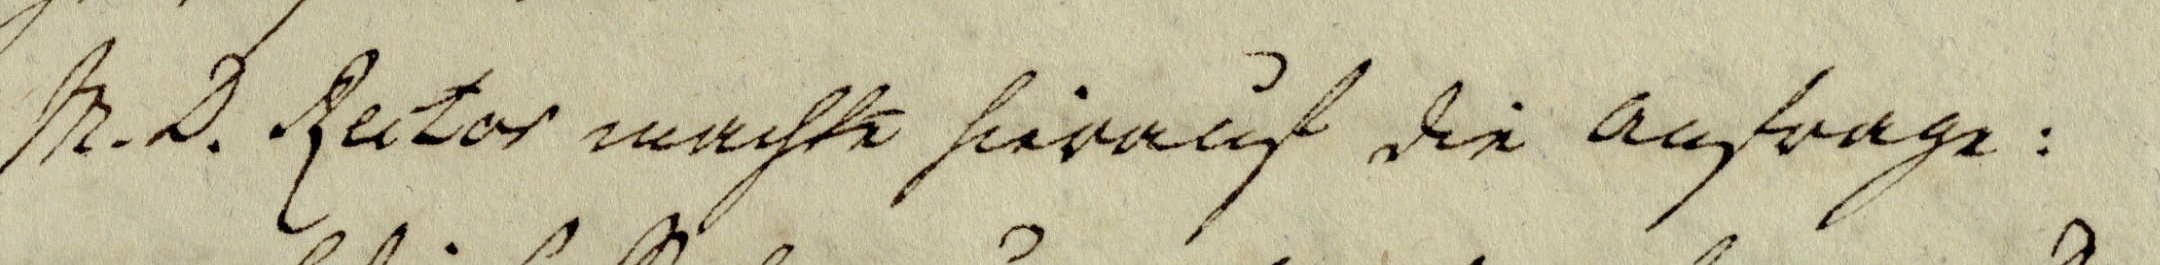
M. D. Rector machte hierauf die Anfrage:
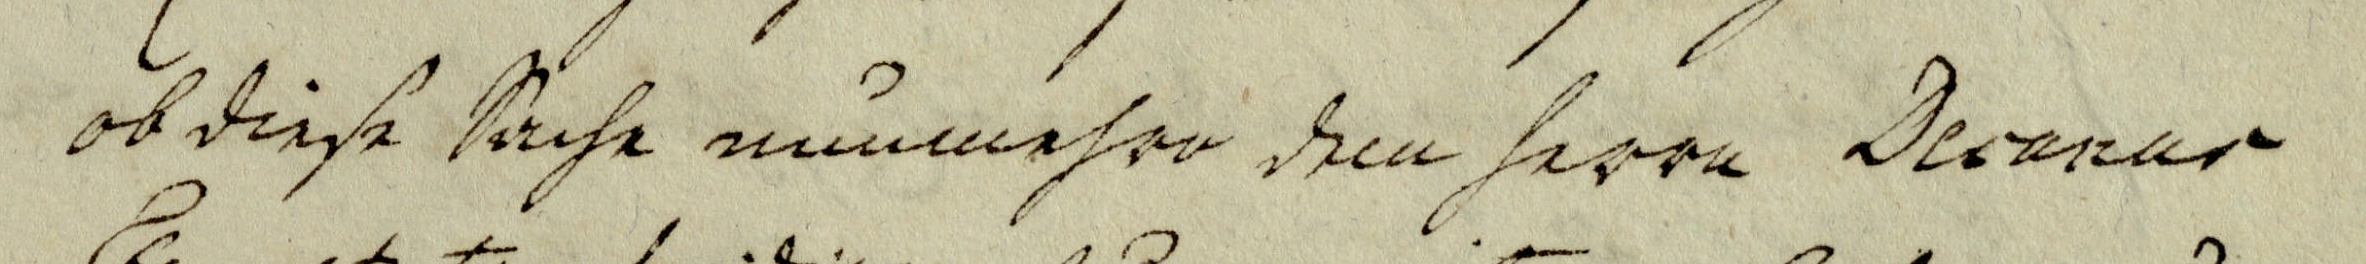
ob diese Sache nunmehro dem Herrn Decanus
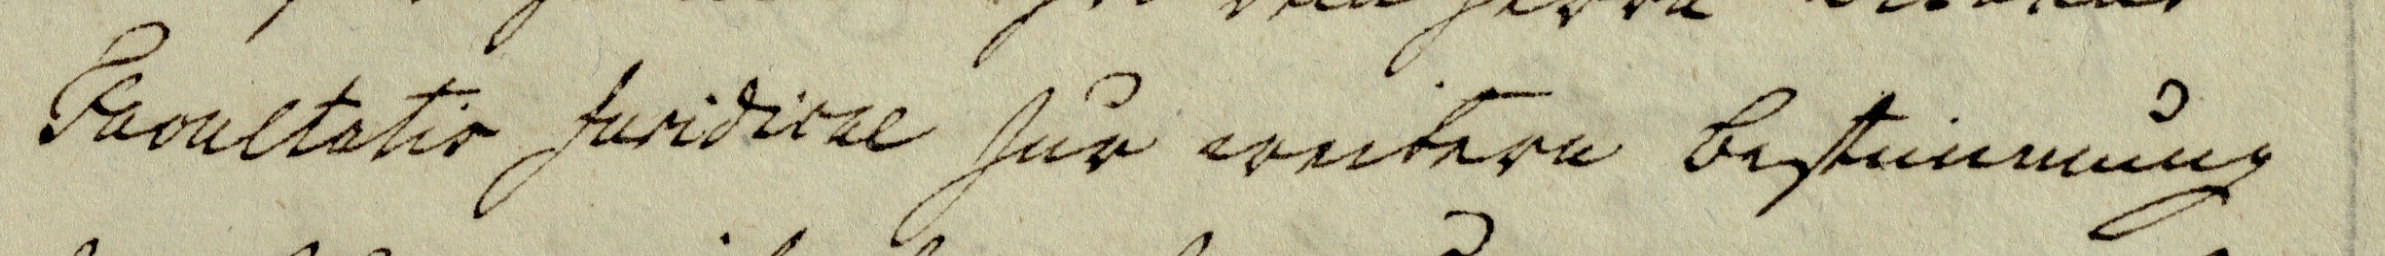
Facultatis Juridicae zur weitern Bestimmung
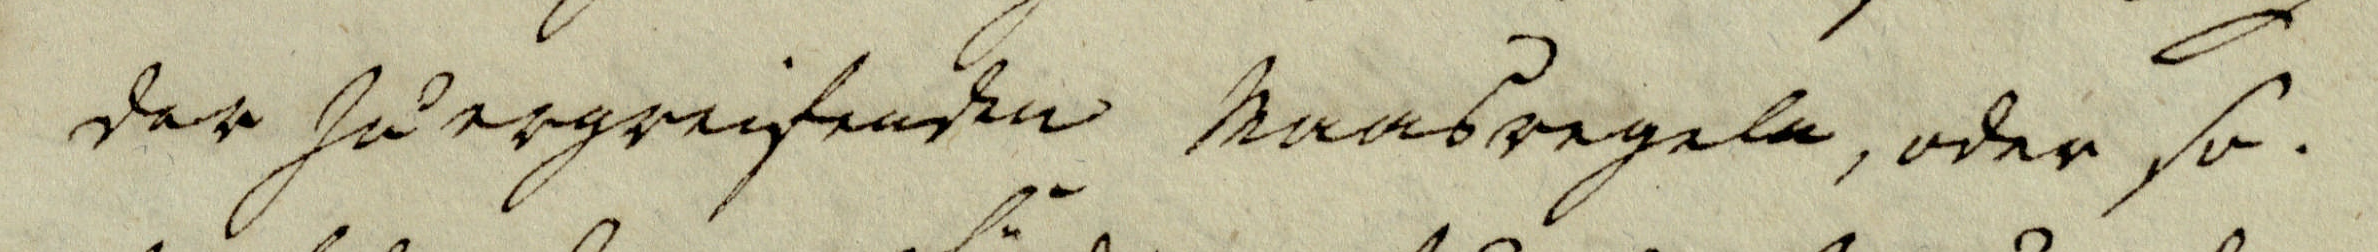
der zu ergreifenden Maasregeln, oder so¬
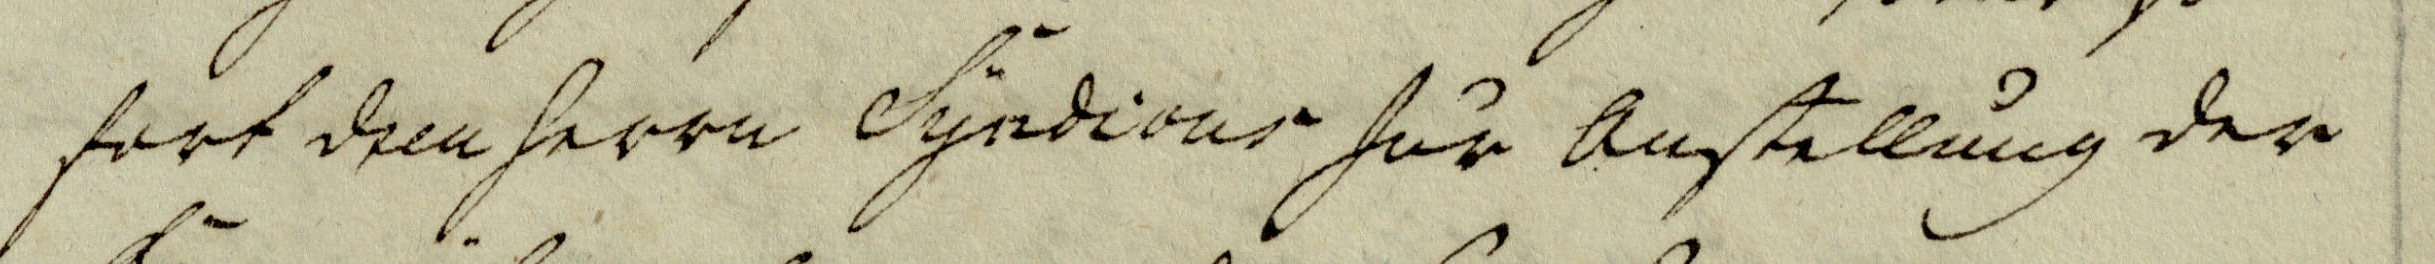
fort dem Herrn Sÿndicus zur Anstellung der
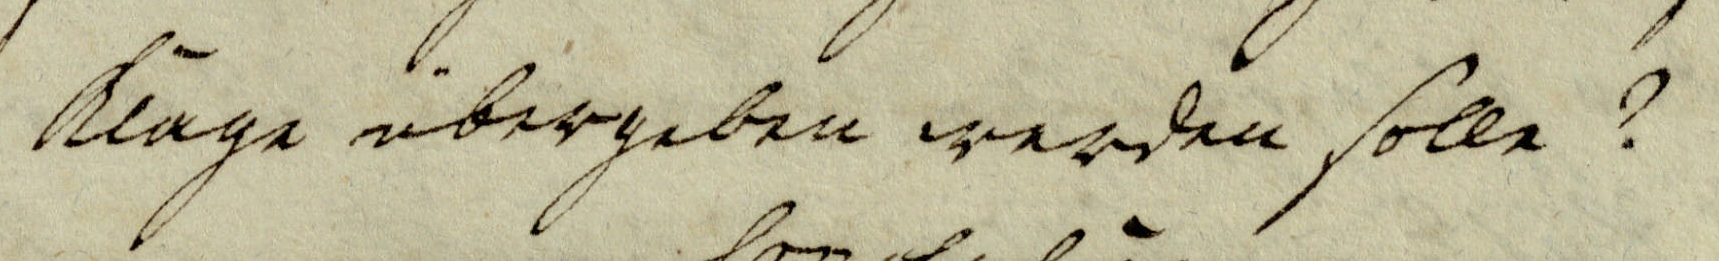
Klage übergeben werden solle?
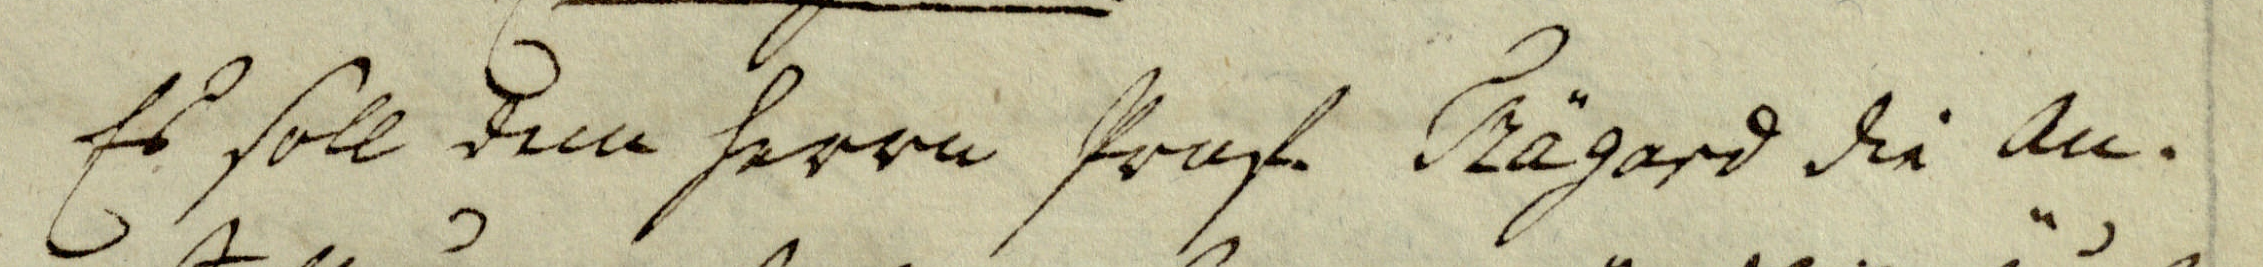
Es soll dem Herrn Prof. Trägård die An¬
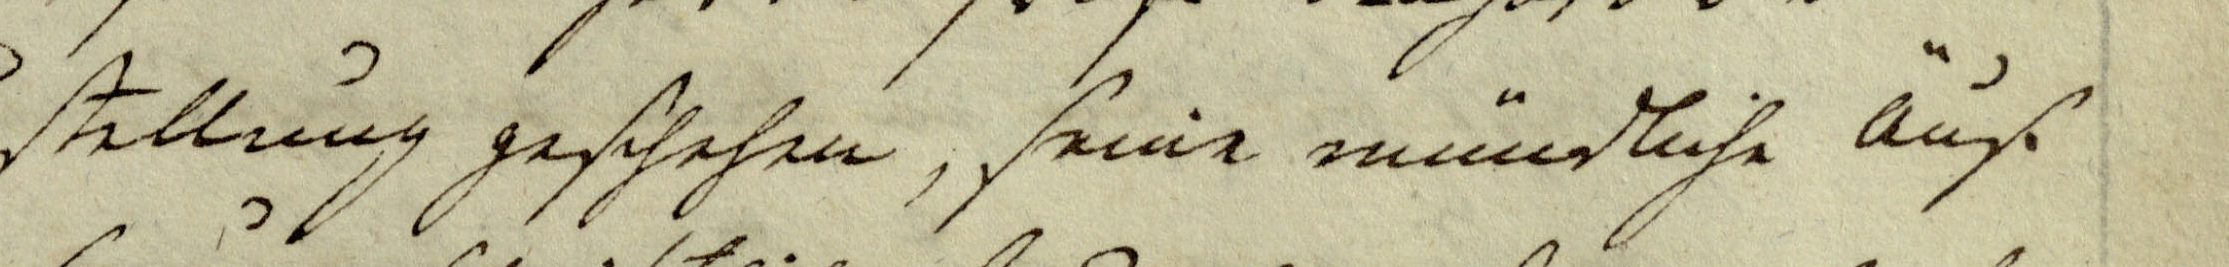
stellung geschehen, seine mündliche Äus¬
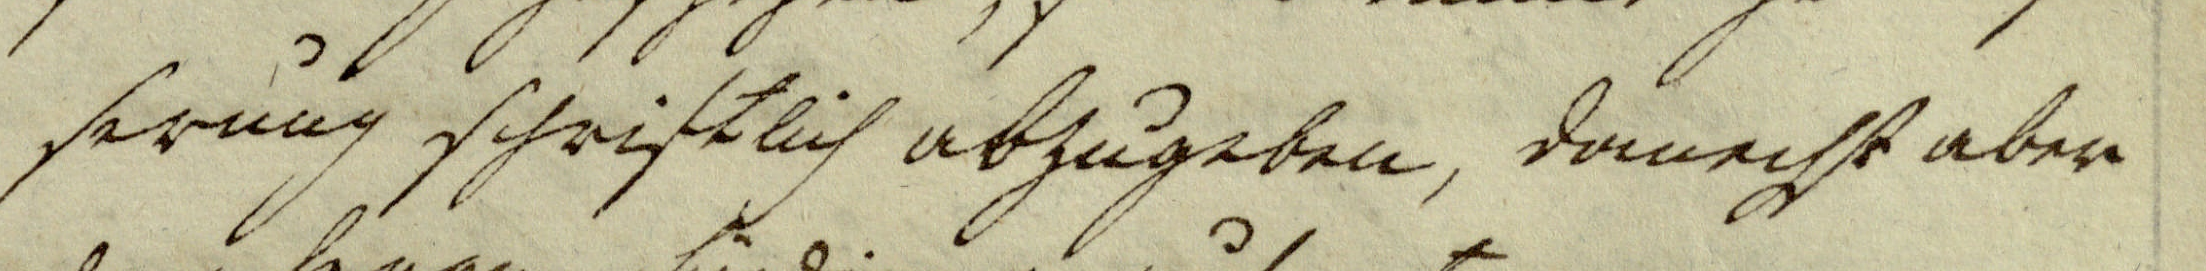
serung schriftlich abzugeben, danechst aber
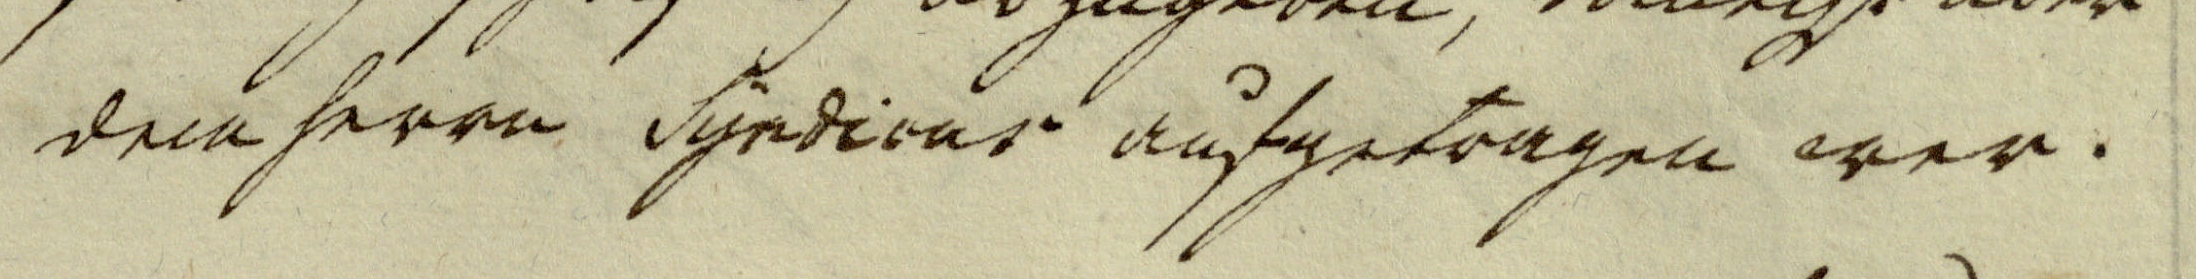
dem Herrn Sÿndicus aufgetragen wer¬
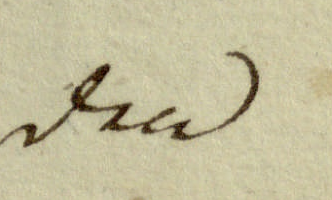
den
